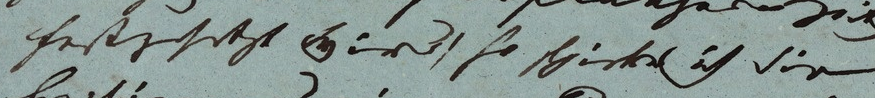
festgesetzt wird, so schicke ich dir
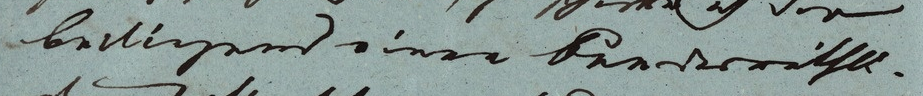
beiliegend einen bundesräthli-
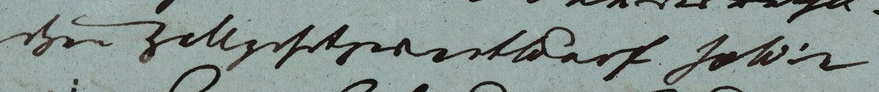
chen Zollgesetzesentwurf sowie
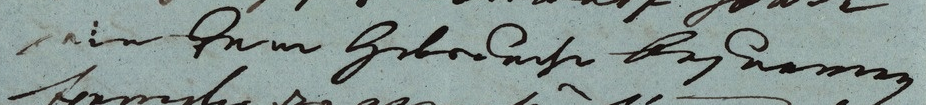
ein zum Gebrauche bequemes
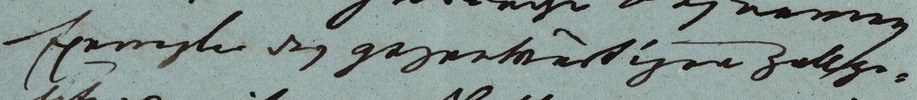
Exemplar des gegenwärtigen Zollge-
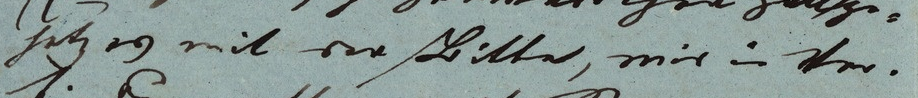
setzes mit der Bitte, mir in Ver-
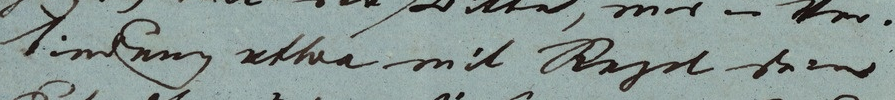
bindung etwa mit Regel Dein
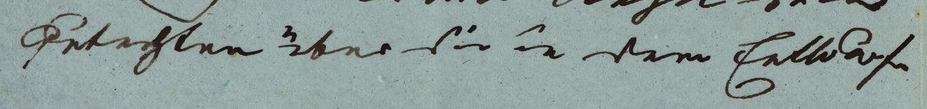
Gutachten über die in dem Entwurfe
